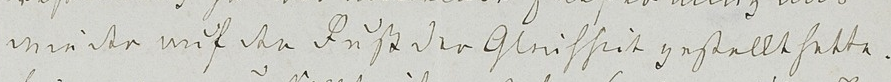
wieder auf den Fuß der Gleichheit gestellt hatte.
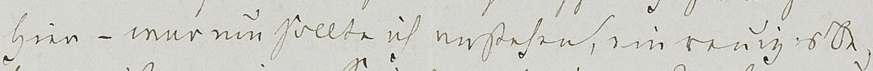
Hier – warum sollte ich anrstehen, ein reuiges Be-
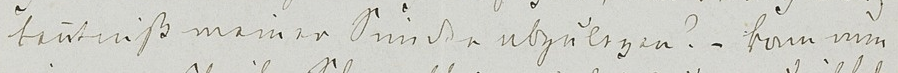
kenntniß meiner Sünden abzulegen? – kam nun
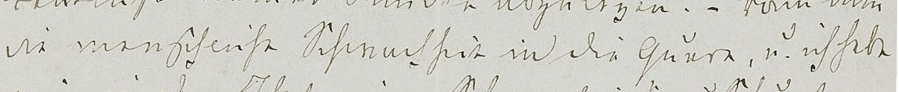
die menschliche Schwachheit in die Quere, u. ich habe
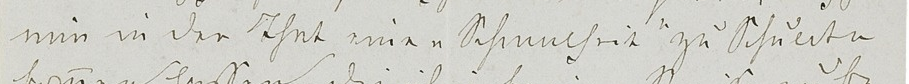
mir in der That eine «Schmalheit» zu Schulden
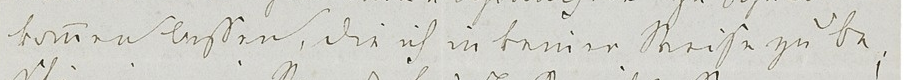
kommen lassen, die ich in keiner Weise zu be-
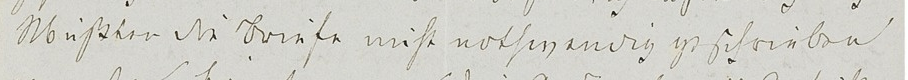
Müßten die Briefe nicht nothwendig geschrieben
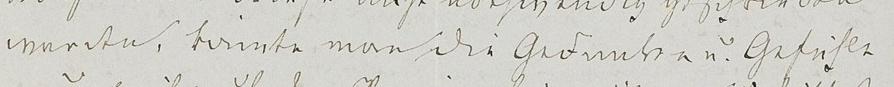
werden, könnte man die Gedanken u. Gefühle
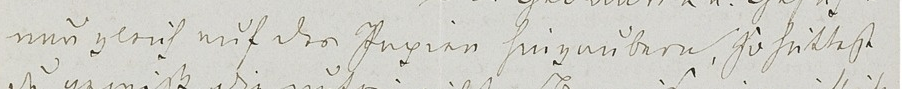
nun gleich auf das Papier hinzaubern, so hättest
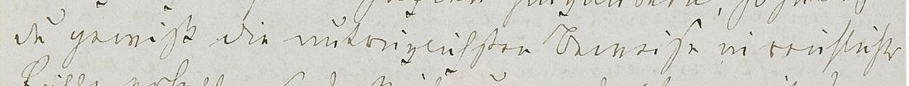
du gewiß die untrüglichsten Beweise in reichlicher
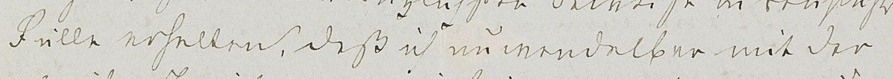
Fülle erhalten, daß ich unwandelbar mit der
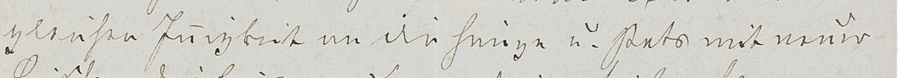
gleichen Innigkeit an dir hänge u. stets mit neuer
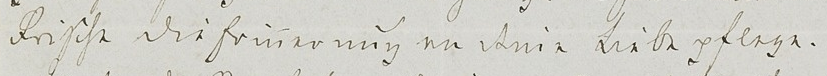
Frische die Erinnerung an deine Liebe pflege.
